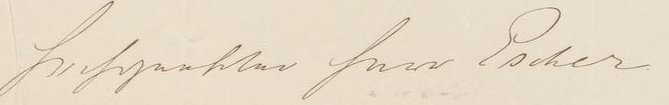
Hochgeehrter Herr Escher
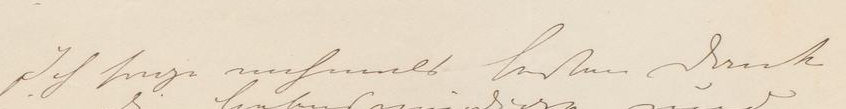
Ich sage nochmals besten Dank
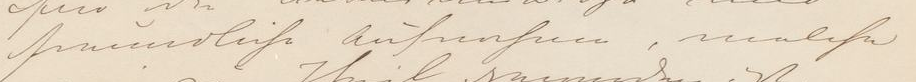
freundliche Aufnahme, welche
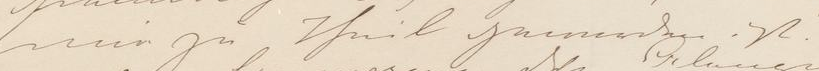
mir zu Theil geworden ist.
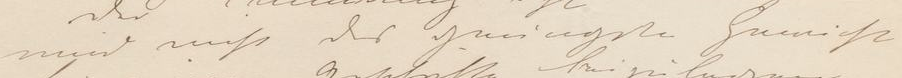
wird nicht das geringste Gewicht
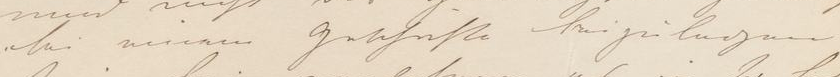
bei meinem Geschäfte beizulegen
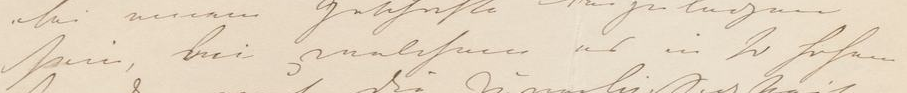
sein, bei welchem es in so hohem
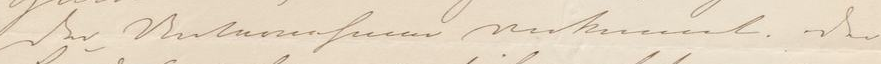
der Unternehmen ankommt. Der
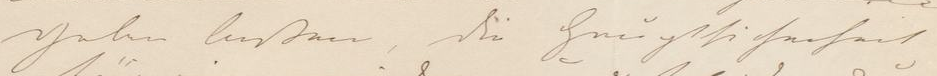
geben laßen, die Hauptsicherheit
